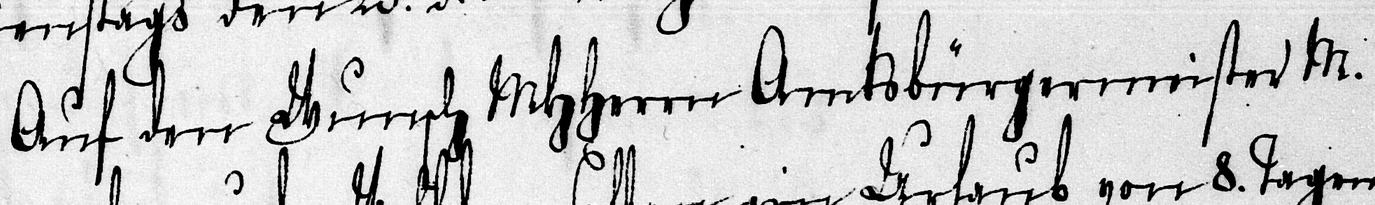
Auf den Wunsch MHHerrn Amtsbürgermeister M.
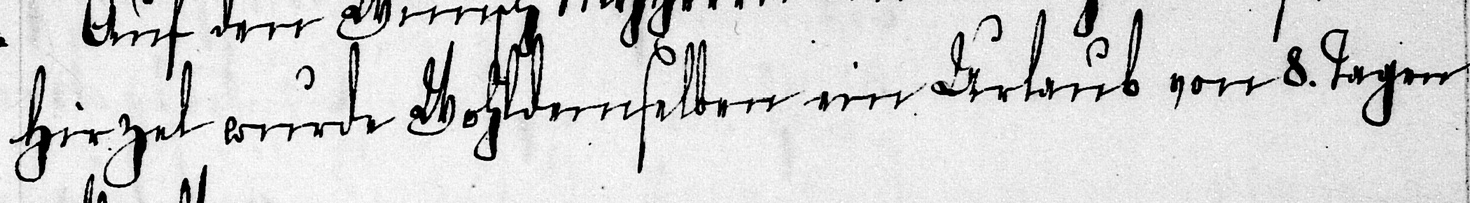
Hirzel wurde Wohldemselben ein Urlaub von 8. Tagen
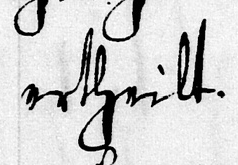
ertheilt.
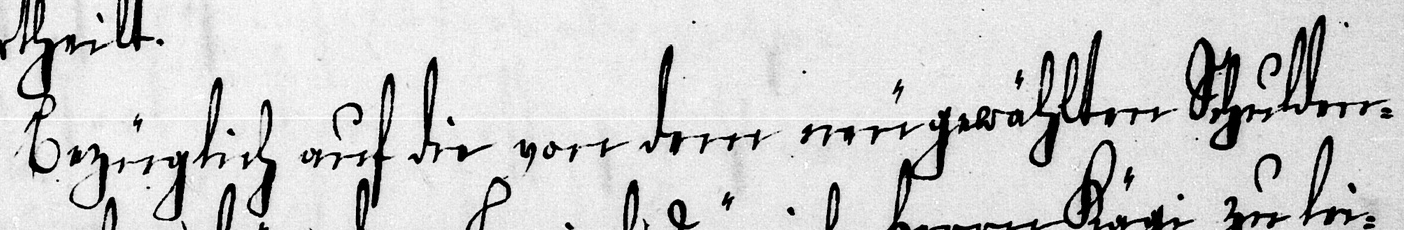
Bezüglich auf die von dem neugewählten Schulden¬
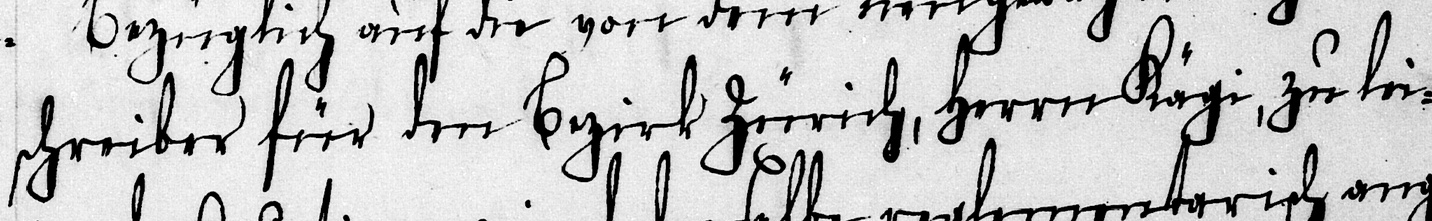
schreiber für den Bezirk Zürich, Herrn Kägi, zu lei¬
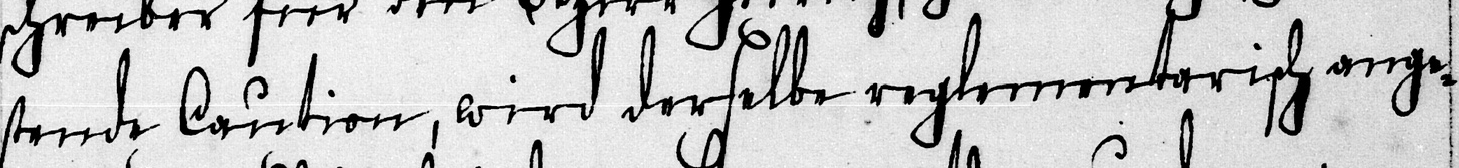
stende Caution, wird derselbe reglementarisch ange¬
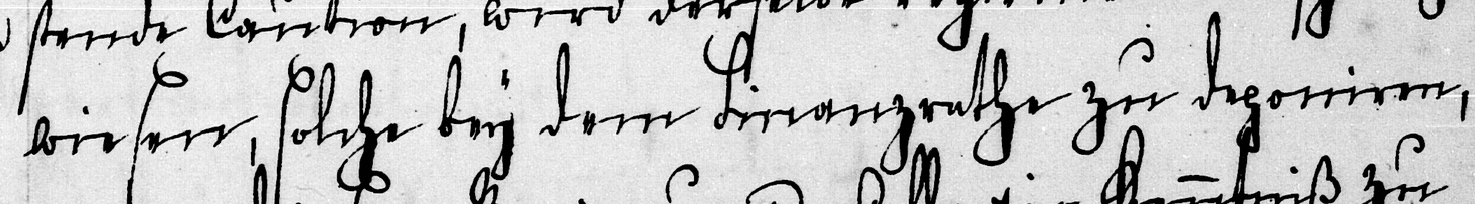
wiesen, solche bey dem Finanzrathe zu deponiren,
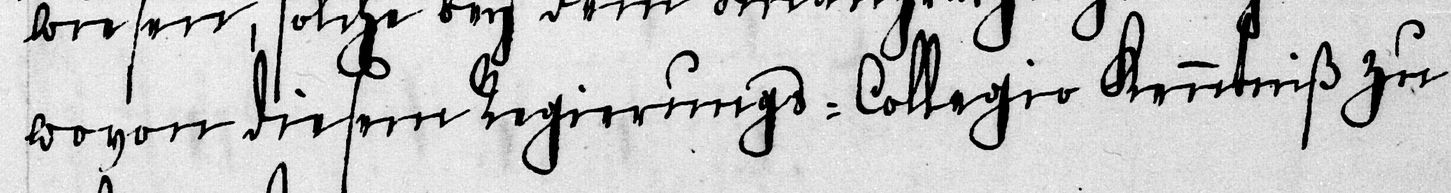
wovon diesem Regierungs-Collegio Kenntniß zu
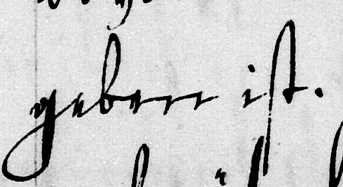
geben ist.
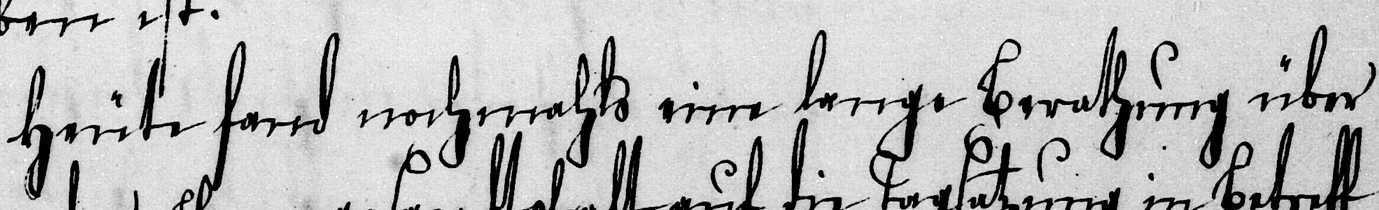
Heute fand nochmahls eine lange Berathung über
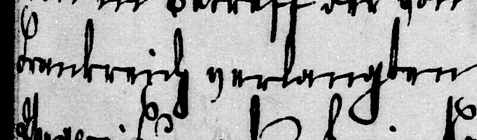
Frankreich verlangten
